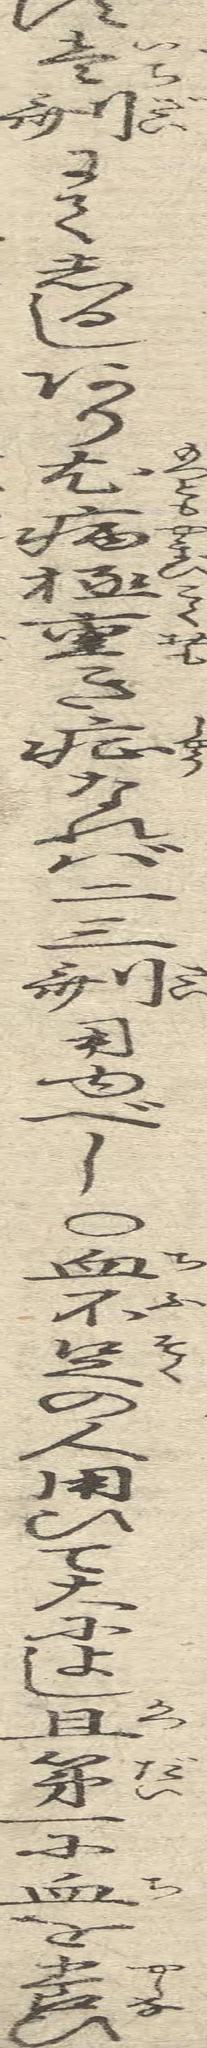ず壱剤にてしるしあり尤病極重き症なれば二三剤用ゆべし○血不足の人用ひて大によし且第一に血を養ひ
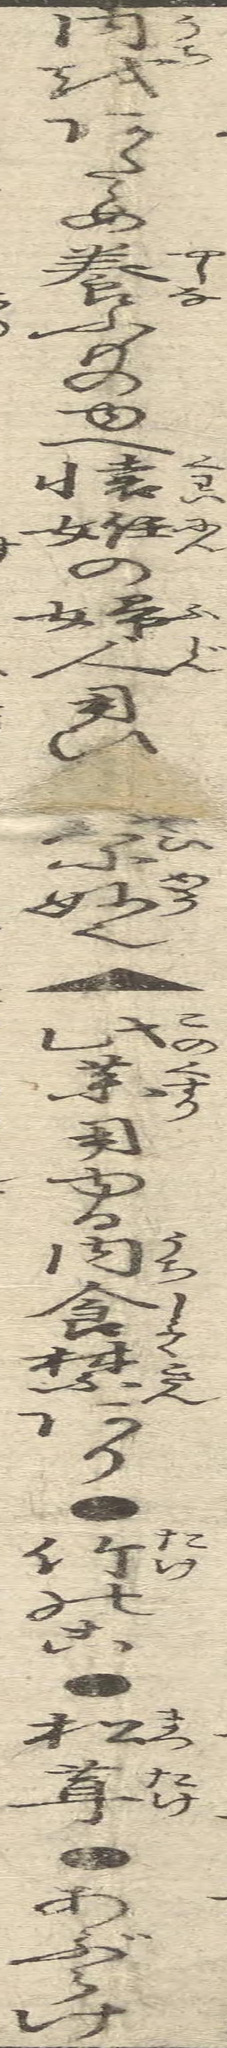内をあたゝめ養ふものゆへ懐妊の婦人用ひ大に妙也▲此薬用ゆる内食禁あり●竹のこ●松茸●あぶらけ
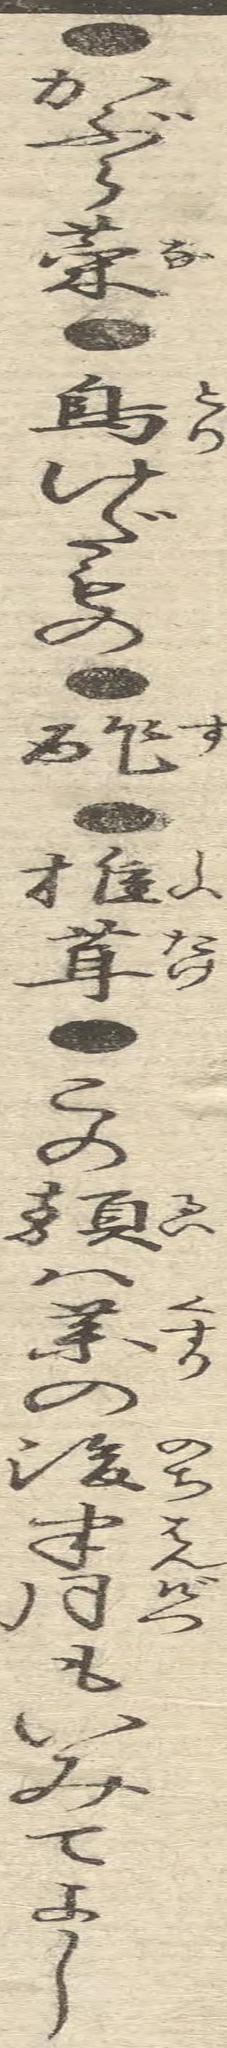●かぶら菜●鳥けだもの●酢●椎茸●この類は薬の後半月もいみてよし
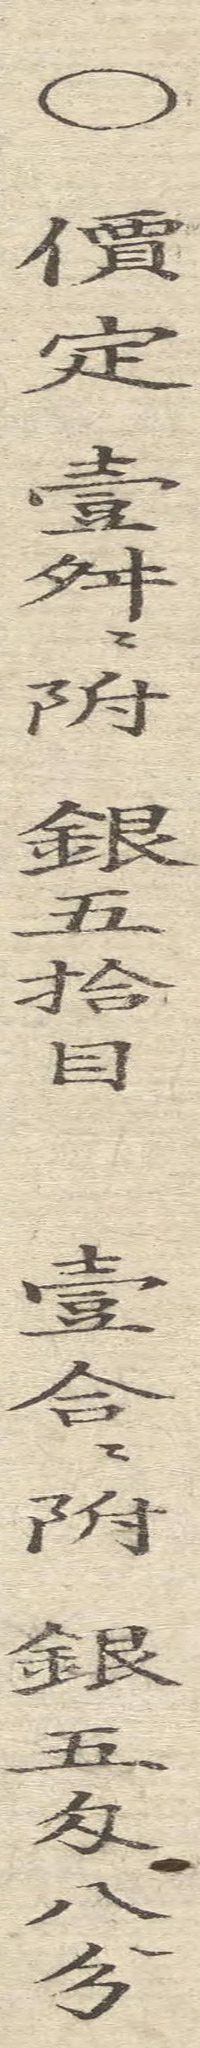○価定壱舛に附銀五拾目壱合に附銀五匁八分
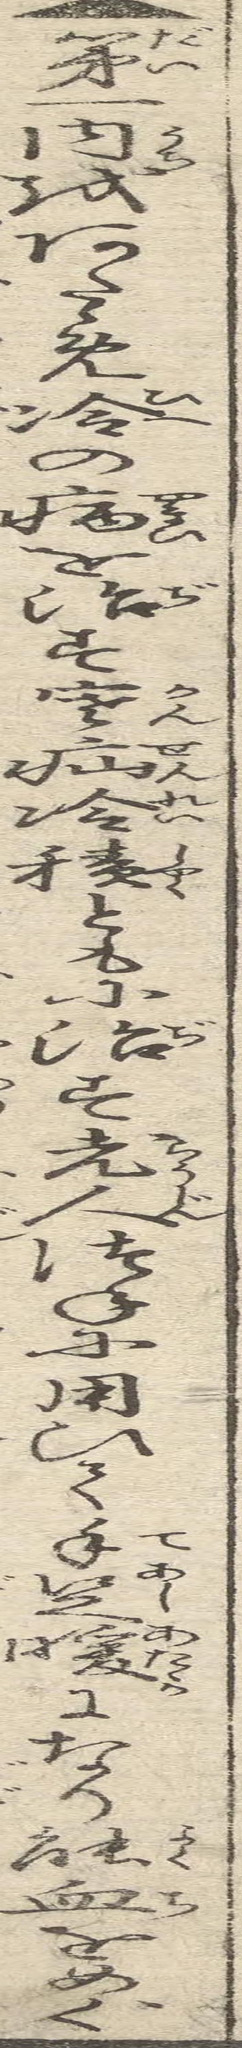▲第一内をあたゝめ冷の病を治す寒疝冷積ともに治す老人つねに用ひて手足暖になり能血をめぐ
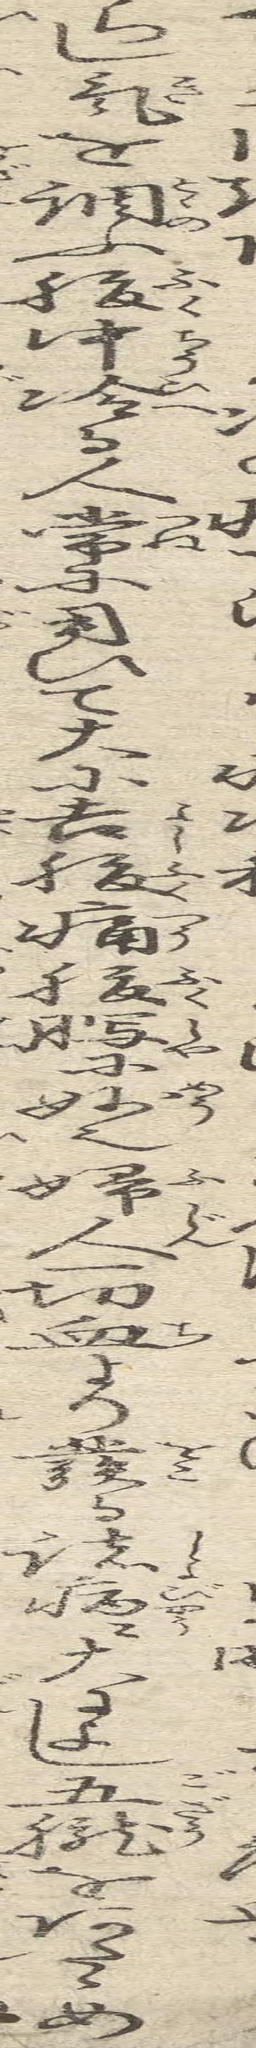らし気を調ふ腹中冷る人常に用ひて大に吉腹痛腹瀉に妙也婦人一切血より発る諸病に大によし五臓をあたゝめ
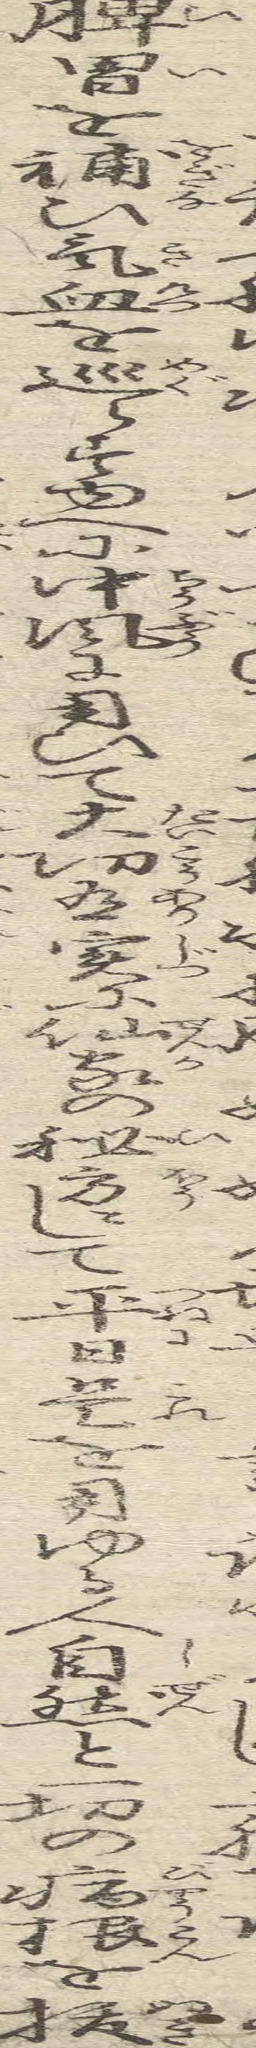脾胃を補ひ気血を巡らすゆへに中風に用ひて大功有実に仙家の秘方にして平日是を用ゆる人自然と一切の病根を抜
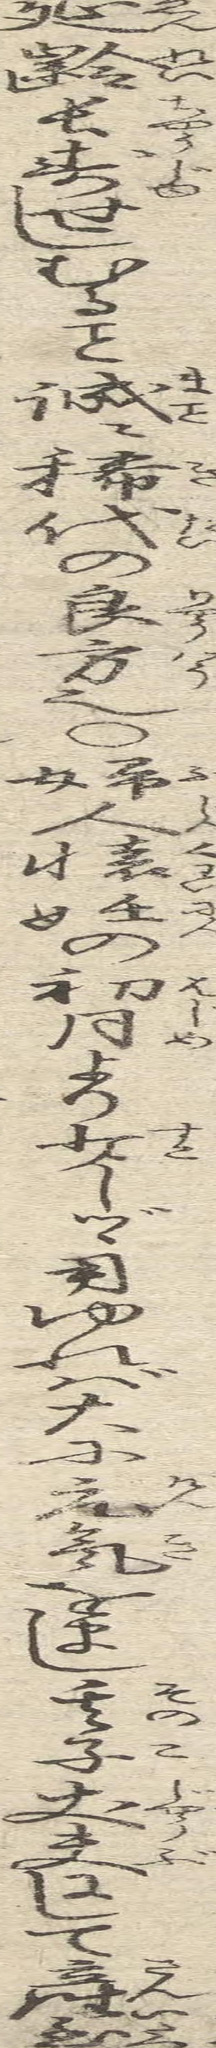延齢長寿せしむること誠に稀代の良方也○婦人懐妊の初月より少しづゝ用ゆれば大に元気をまし其子丈夫にして産至
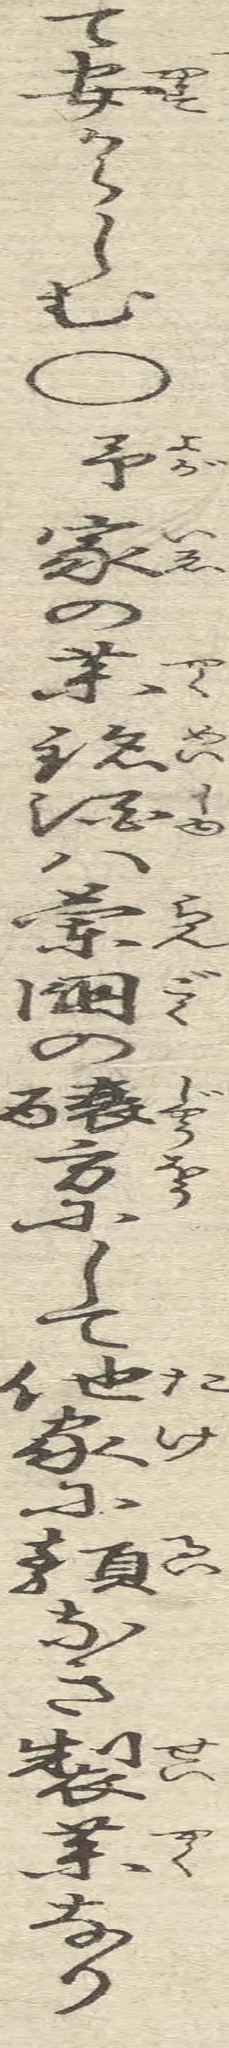て安からしむ○予家の薬銘酒は蘭国の醸方にして他家に類なき製薬なり
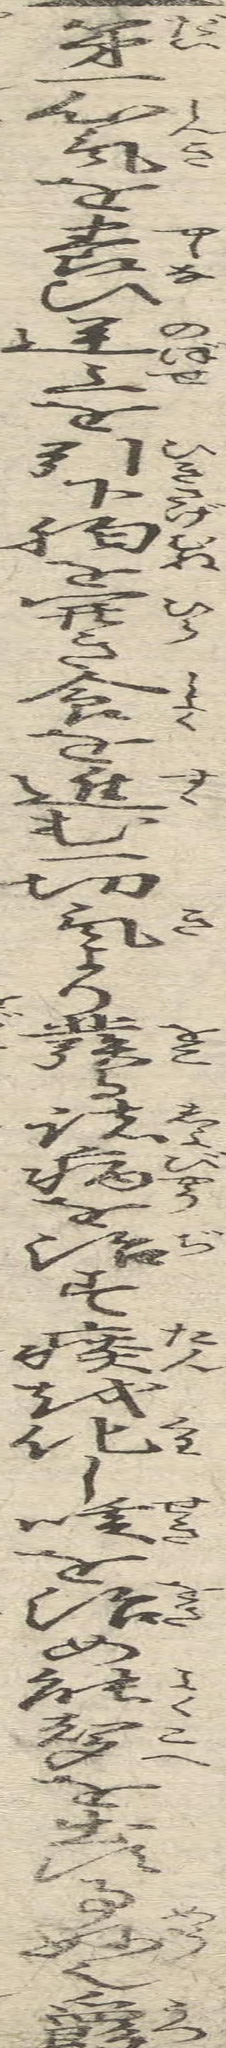▲第一心気を養ひ逆上を引下胸を開き食を進む一切気より発る諸病を治す痰を化し咳を治め能声を出す事妙なり鬱
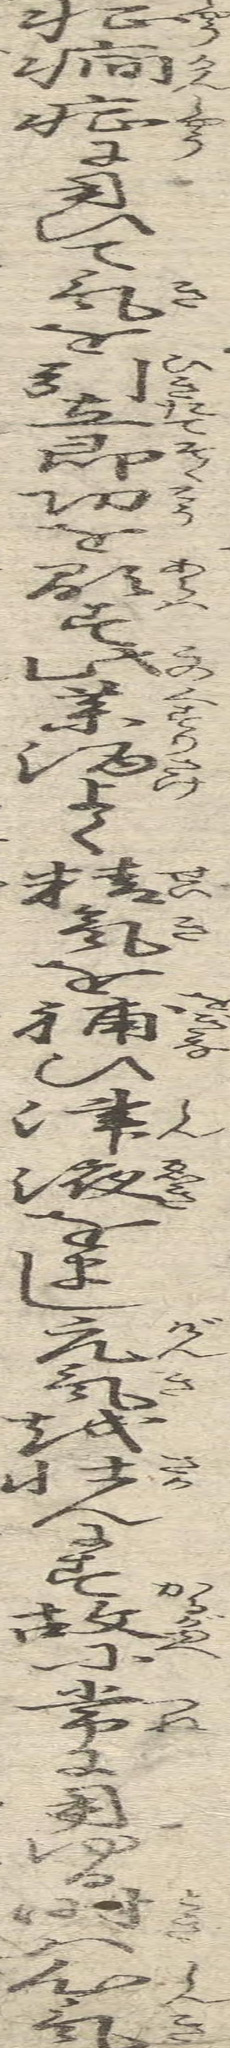症癇症に用ひて気を引立即功を顕す此薬酒よく精気を補ひ津液をまし元気を壮んにす故に常に用ゆる時は心気
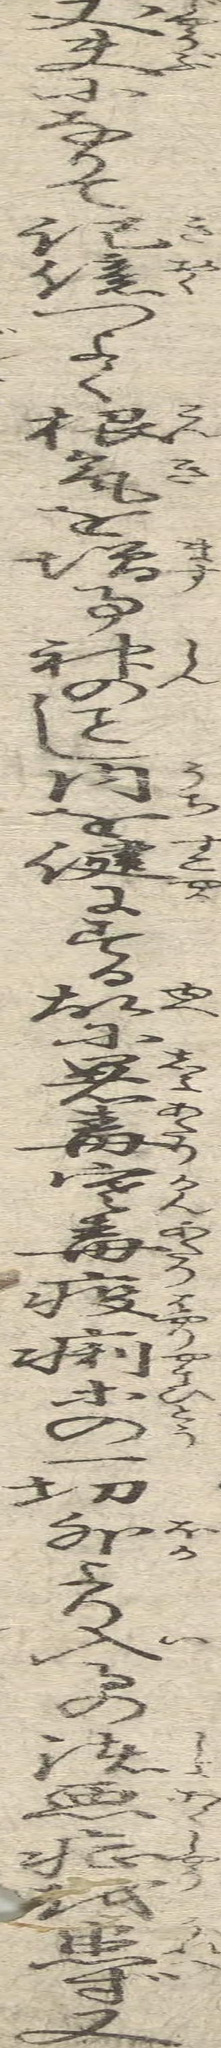丈夫になりて記臆つよく根気を増事神のことし内を健にする故に暑毒寒毒疫痢等の一切外より入るの諸悪症を患ず又
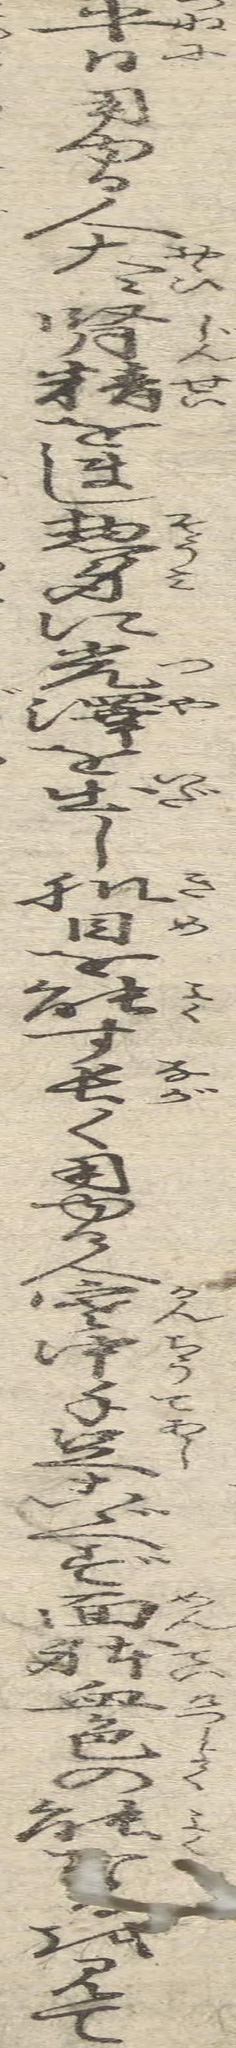平日用ゆる人大に腎精をまし惣身に光沢を出し肌目を能す長く用ゆる人寒中手足こゞへず面体血色の能なるを見て
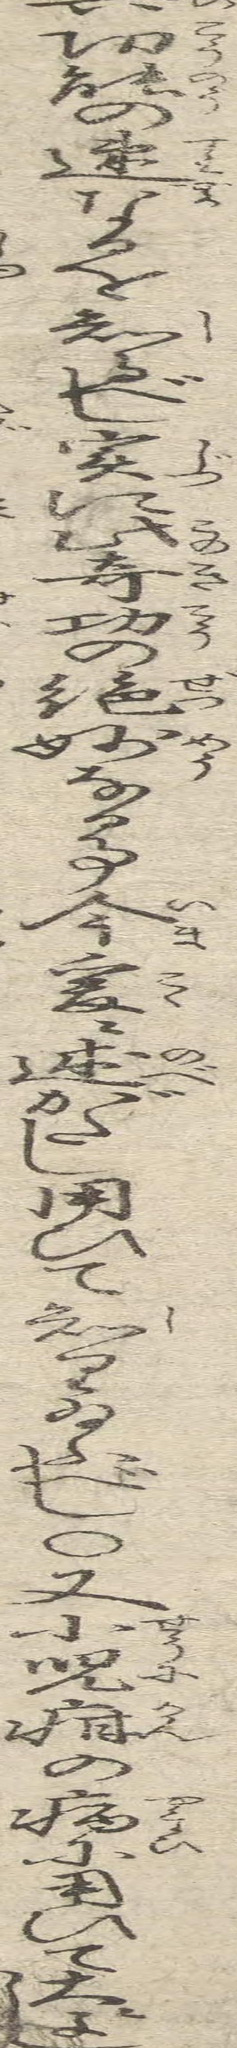其功能の速なるを知るべし実に此奇功の絶妙なる事今爰に述がたし用ひて知り給ふべし○又小児疳の病に用ひて大によし
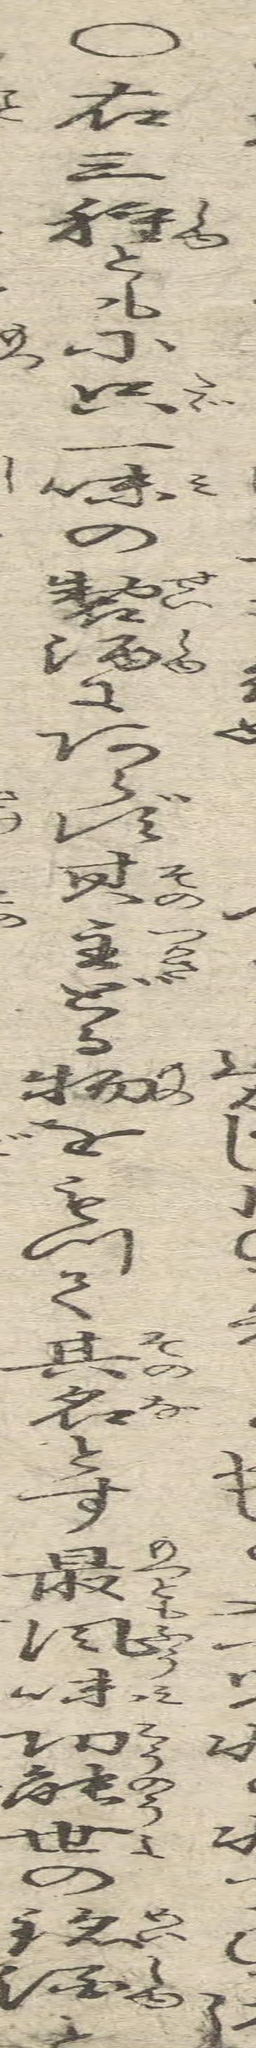○右三種ともに只一味の製酒にあらず其主どる物をもつて其名とす最風味功能世の銘酒と

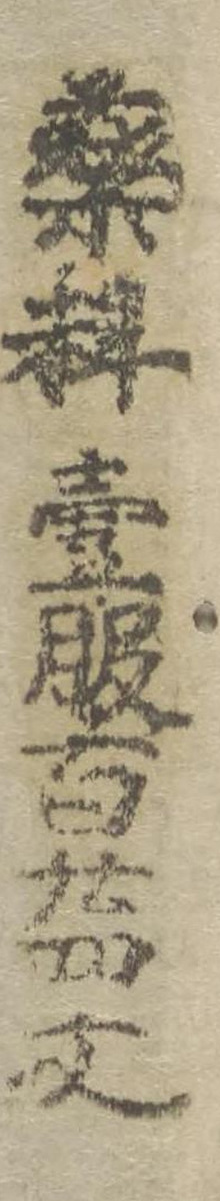薬料壱服百廿四文
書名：浪華薬種問屋能書張交帖. 一
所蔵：国立国会図書館 National Diet Library, JAPAN
